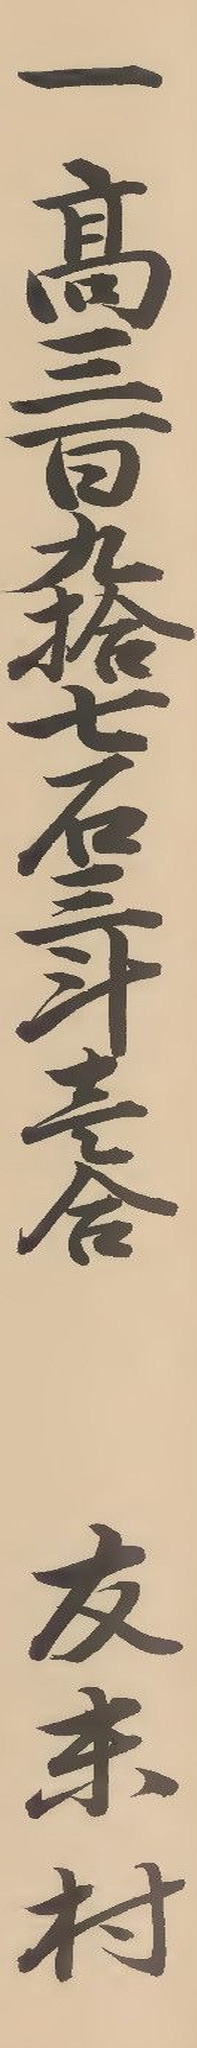一高三百九拾七石三斗壱合友末村
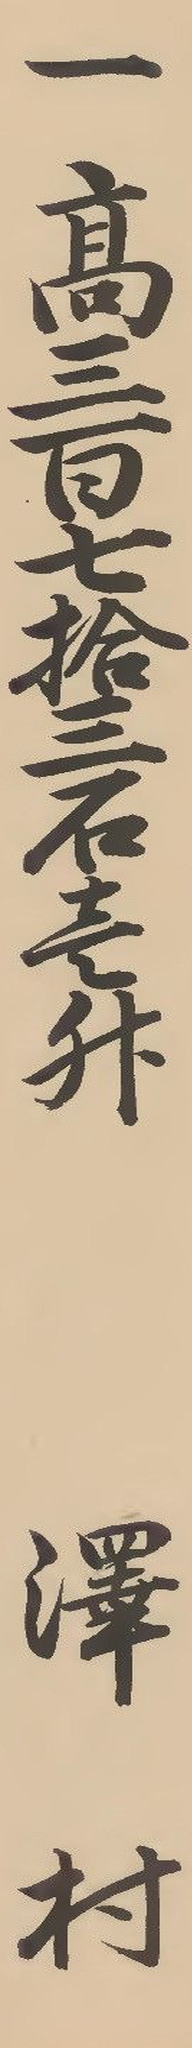一高三百七拾三石壱升沢村
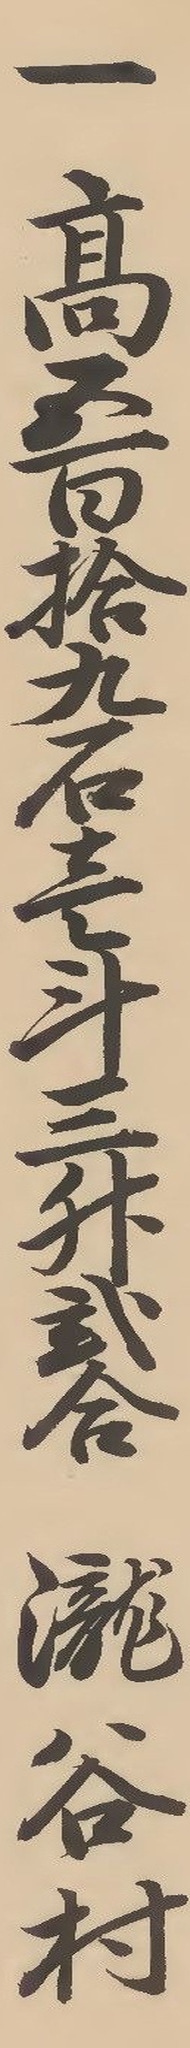一高五百拾九石壱斗三升弐合滝谷村
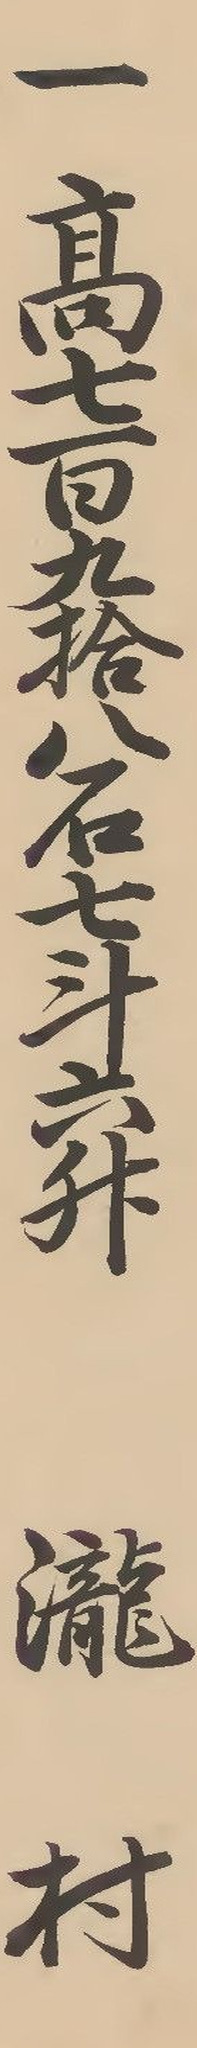一高七百九拾八石七斗六升滝村

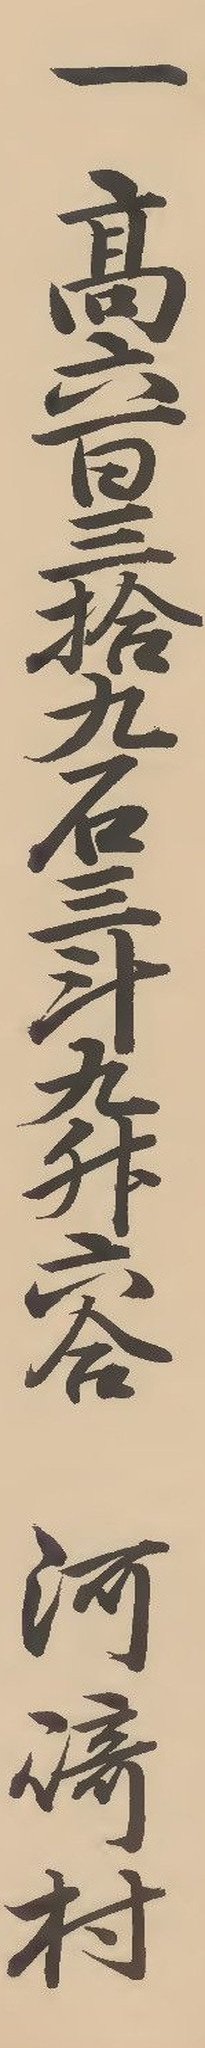一高六百三拾九石三斗九升六合河崎村
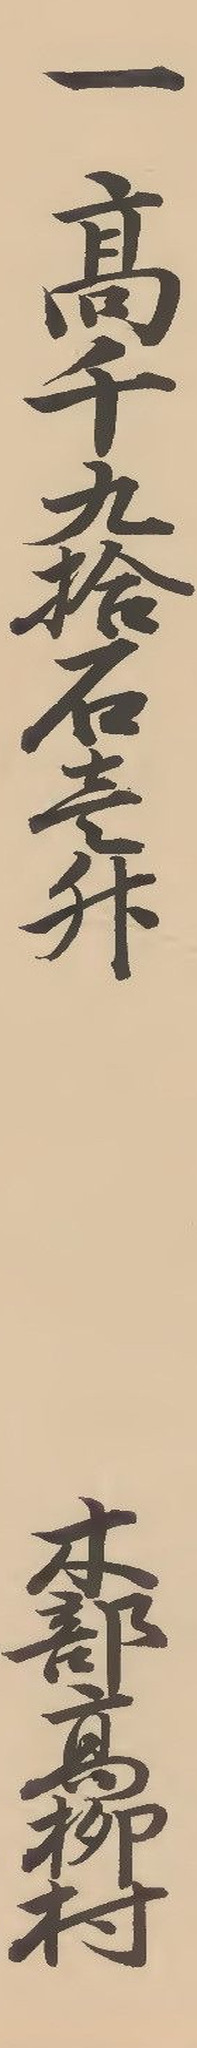一高千九拾石壱升木部高柳村
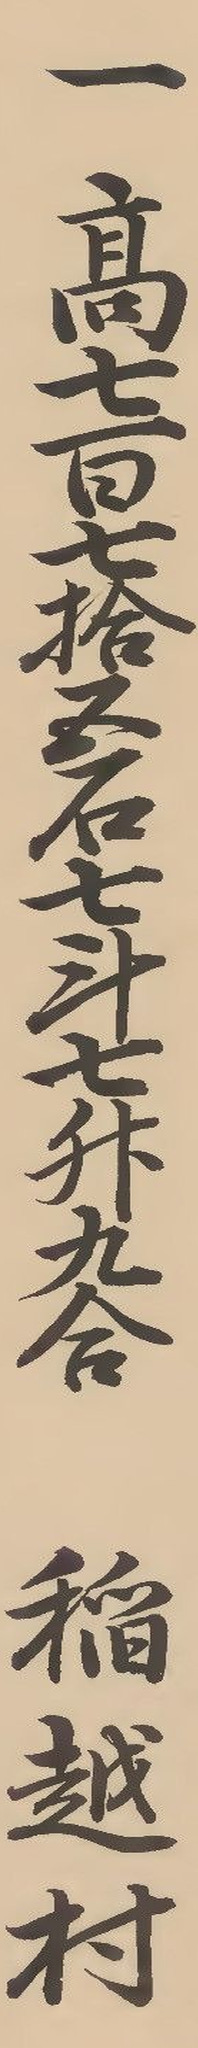一高七百七拾五石七斗七升九合稲越村
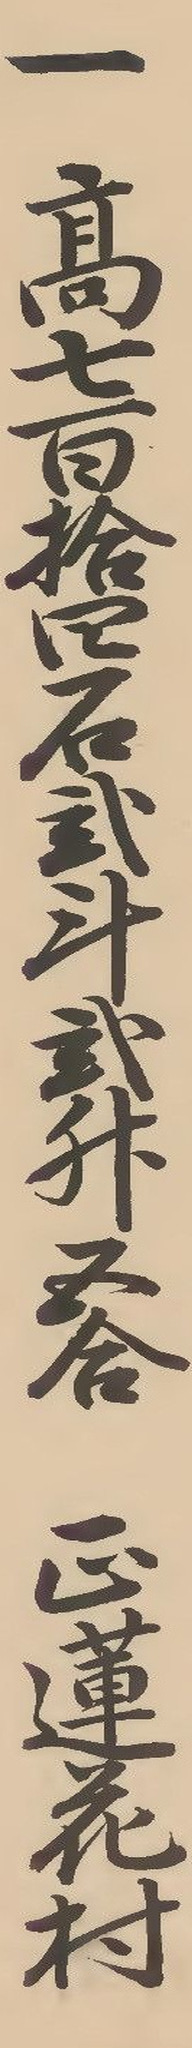一高七百拾四石弐斗弐升五合正蓮花村

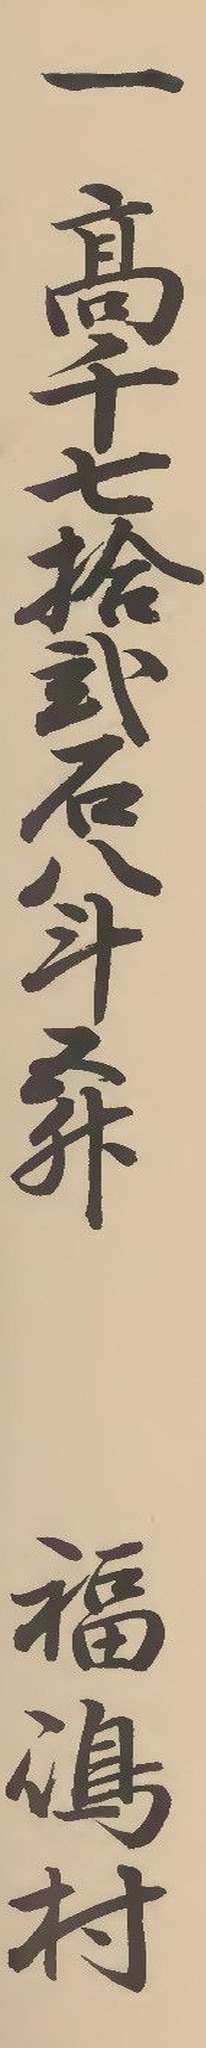一高千七拾弐石八斗五升福島村
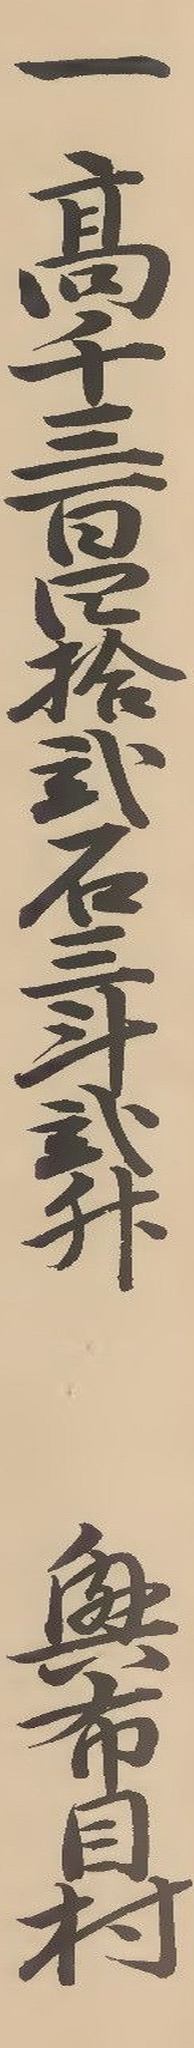一高千三百四拾弐石三斗弐升興布目村
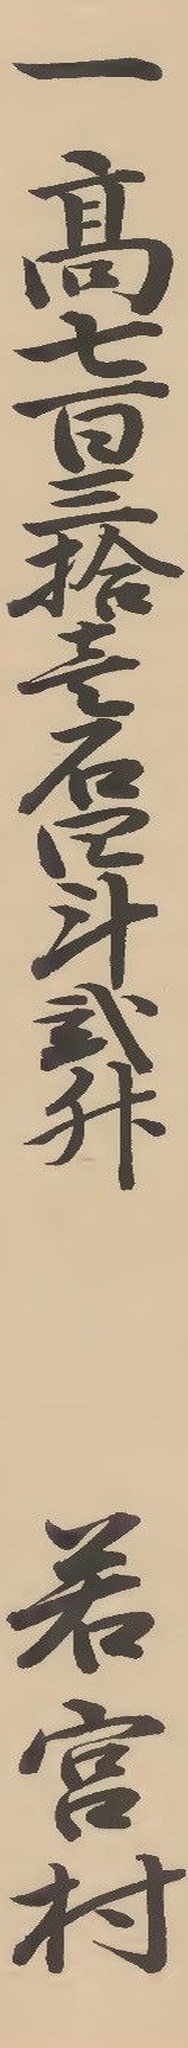一高七百三拾壱石四斗弐升若宮村
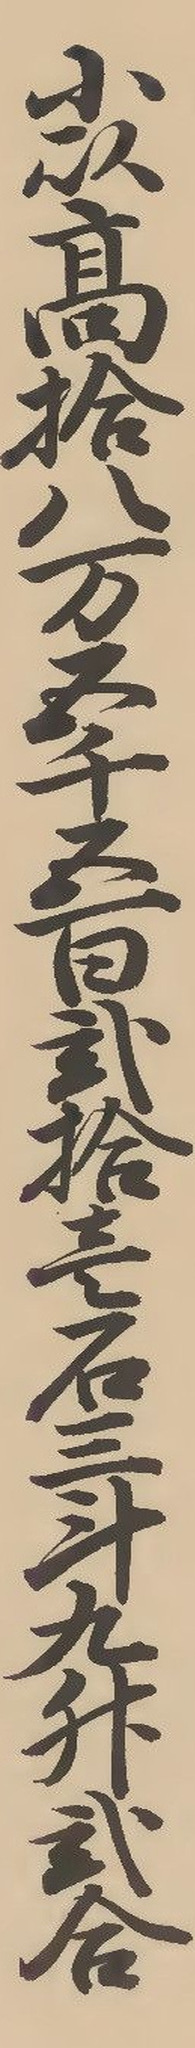小以高拾八万五千五百弐拾壱石三斗九升弐合

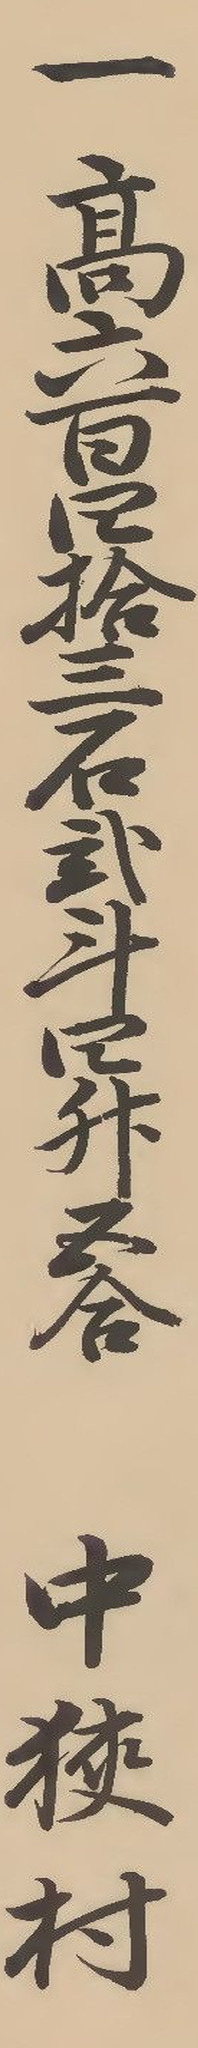一高六百四拾三石弐斗四升五合中狭村
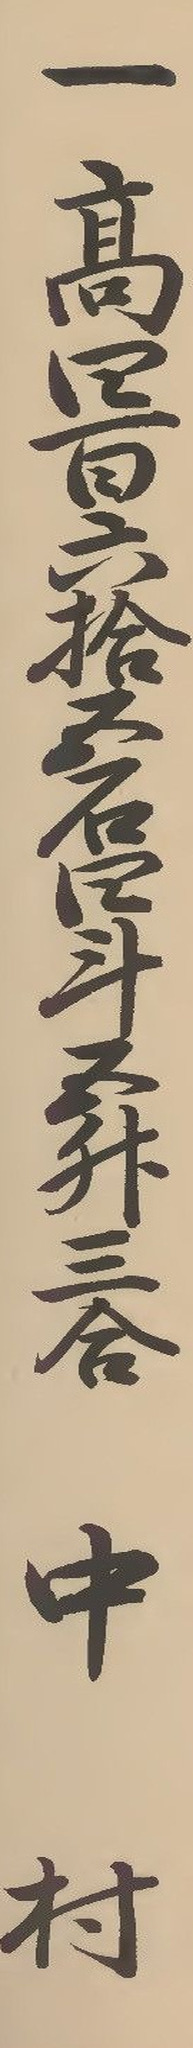一高四百六拾五石四斗五升三合中村
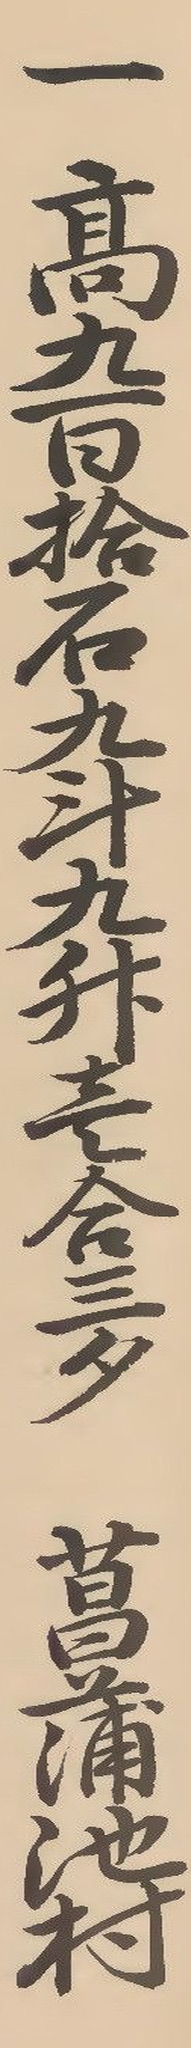一高九百拾石九斗九升壱合三勺菖蒲池村
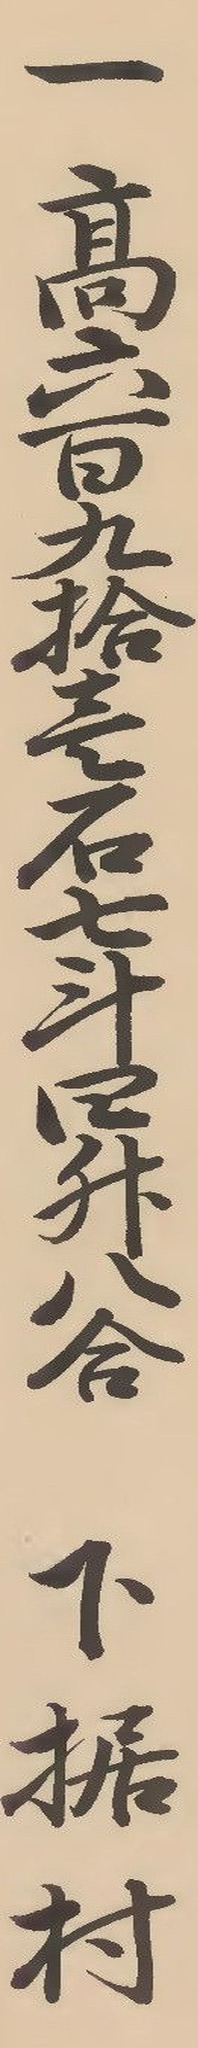一高六百九拾壱石七斗四升八合下据村
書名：越前国郷帳
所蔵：国立公文書館 National Archives of Japan
